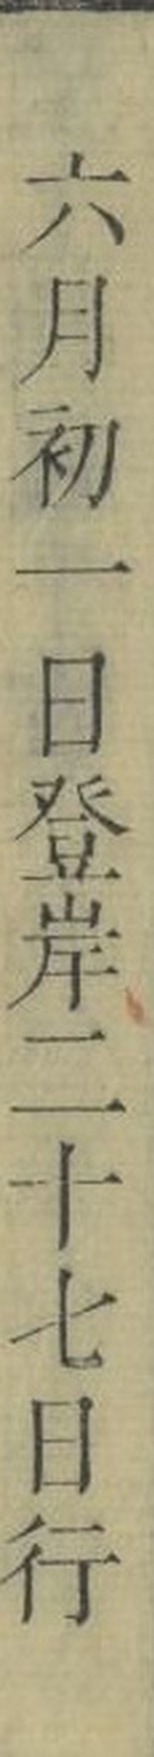六月初一日登岸二十七日行
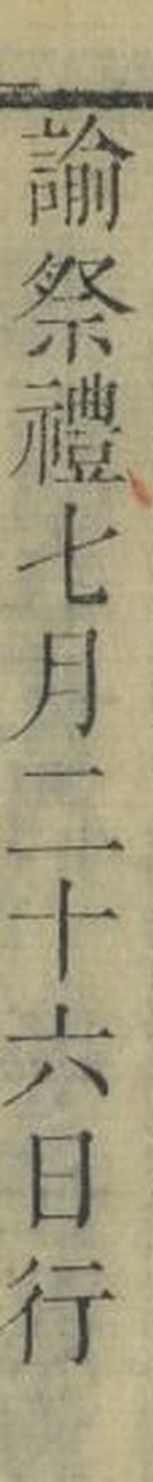諭祭禮七月二十六日行
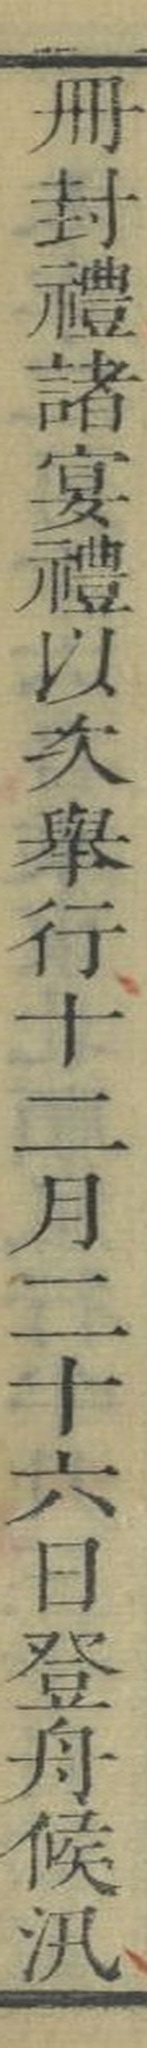冊封禮諸宴禮以次舉行十二月二十六日登舟候汛

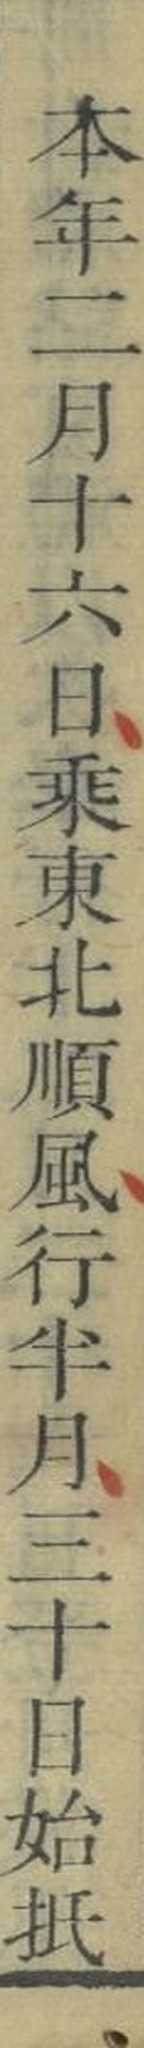本年二月十六日乘東北順風行半月三十日始扺
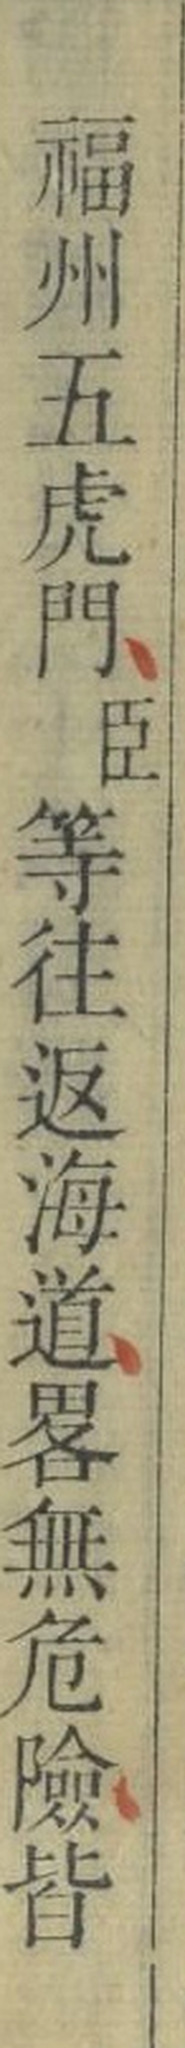福州五虎門臣等往返海道畧危險皆
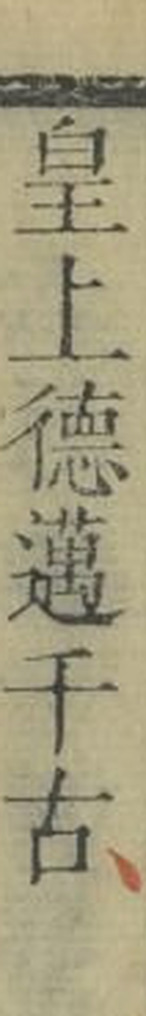皇上德邁千古
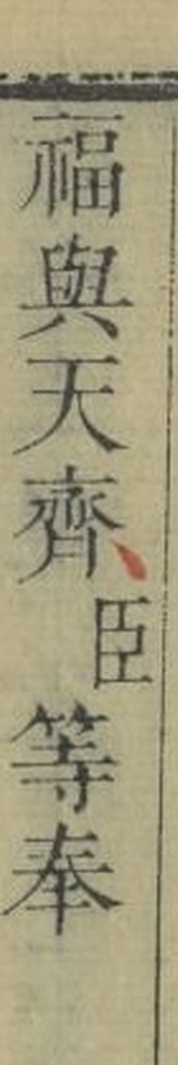福與天齊臣等奉
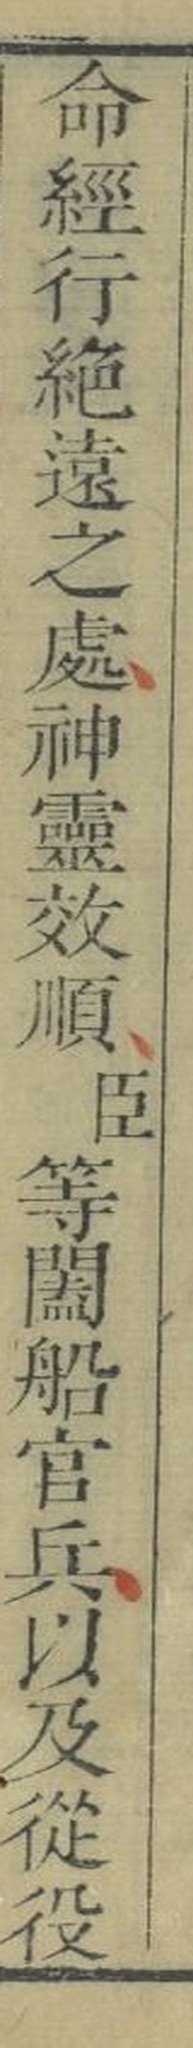命經行絶遠之處神靈效順臣等闔船官兵以及從役
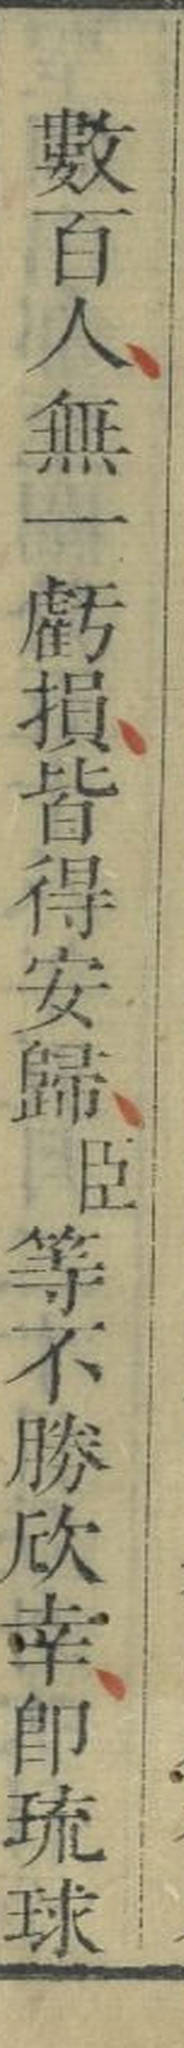數百人無一虧損皆得安歸臣等不勝欣幸卽琉球
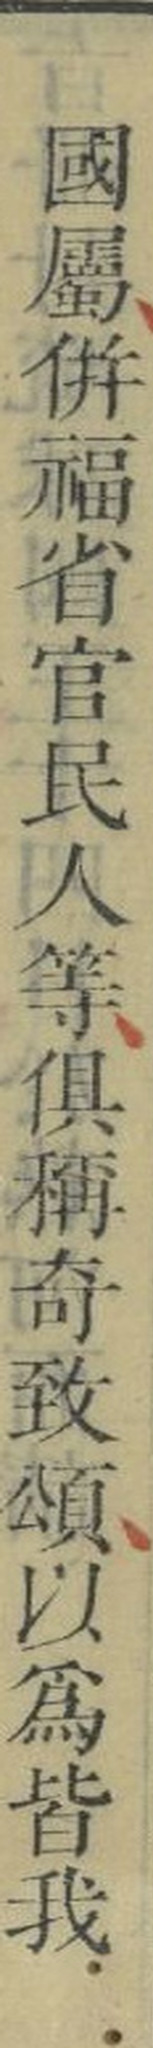國屬倂福省官民人等俱稱奇致頌以爲皆我
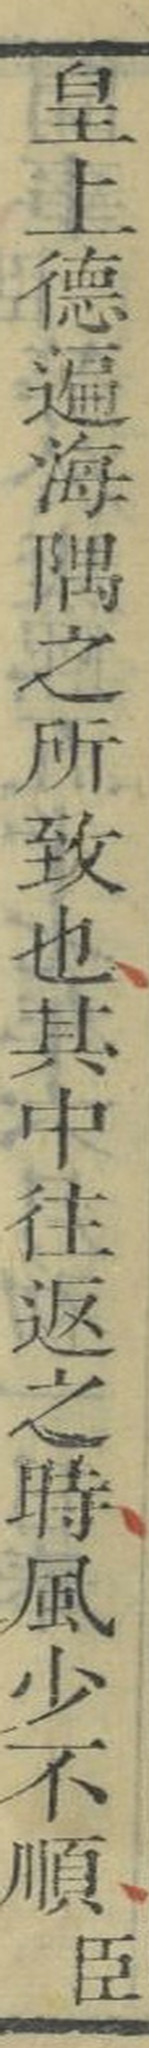皇上德遍海隅之所致也其中往返之時風少不順臣
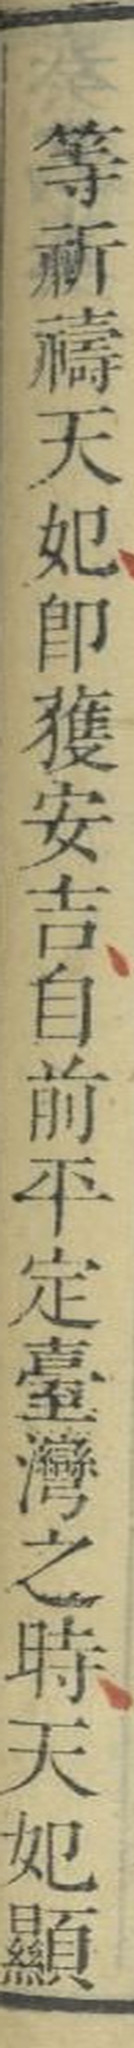等祈禱天妃卽獲安吉自前平定臺灣之時天妃顯
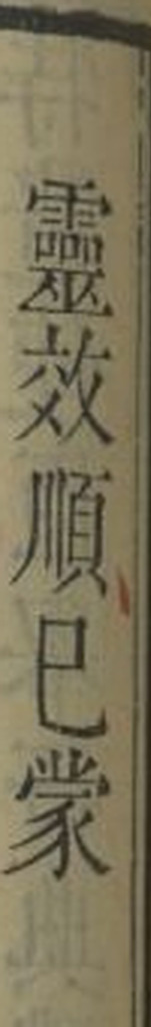靈效順巳蒙
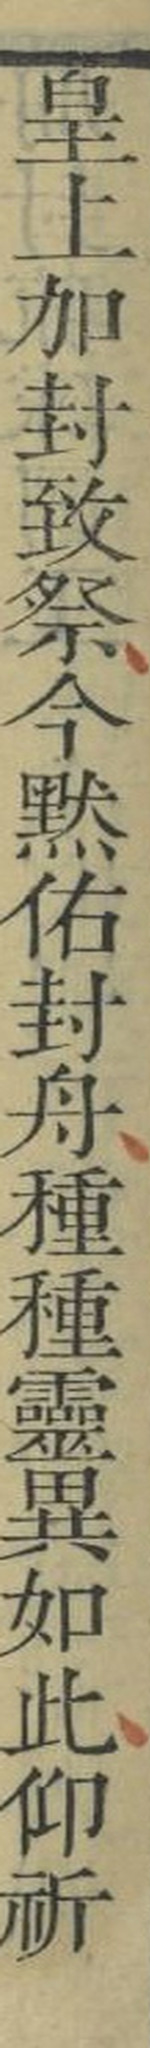皇上加封致祭今默佑封舟種種靈異如此仰祈
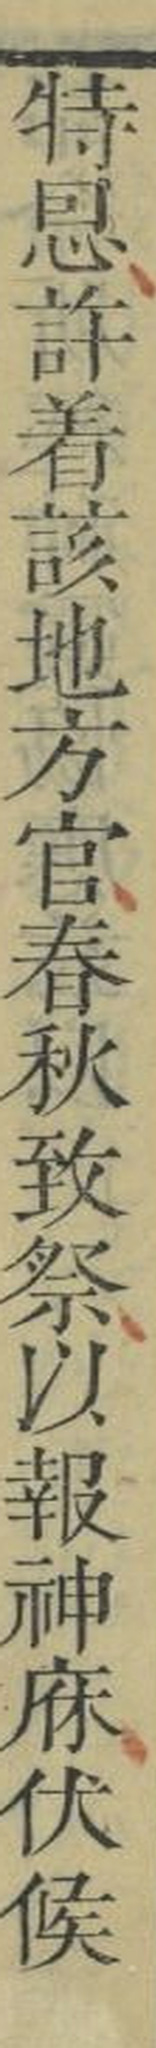特㤙許着該地方官春秋致祭以報神庥伏候
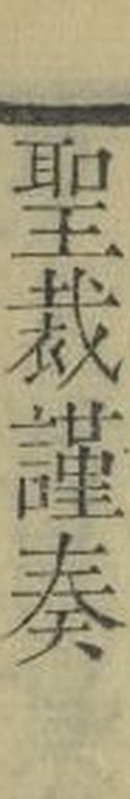聖裁謹奏
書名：中山伝信録 巻一、巻二
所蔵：University of the Ryukyus Library
